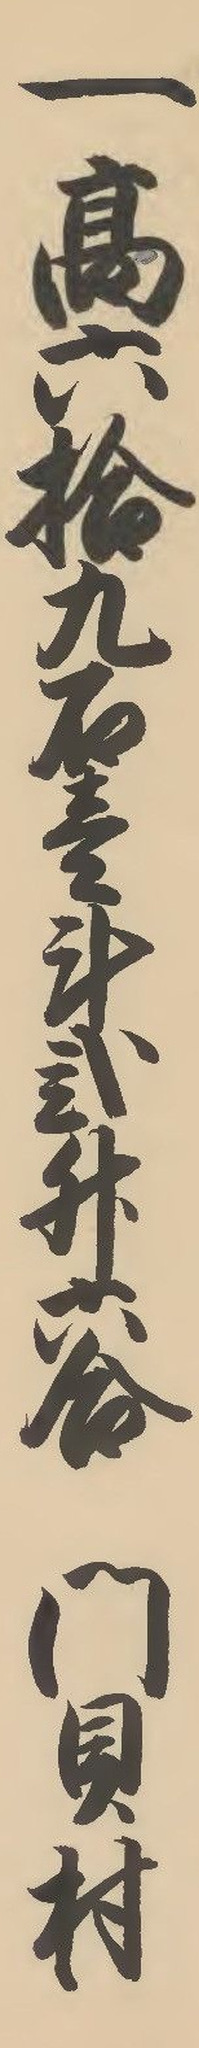一髙六拾九石壱斗弐升六合門貝村
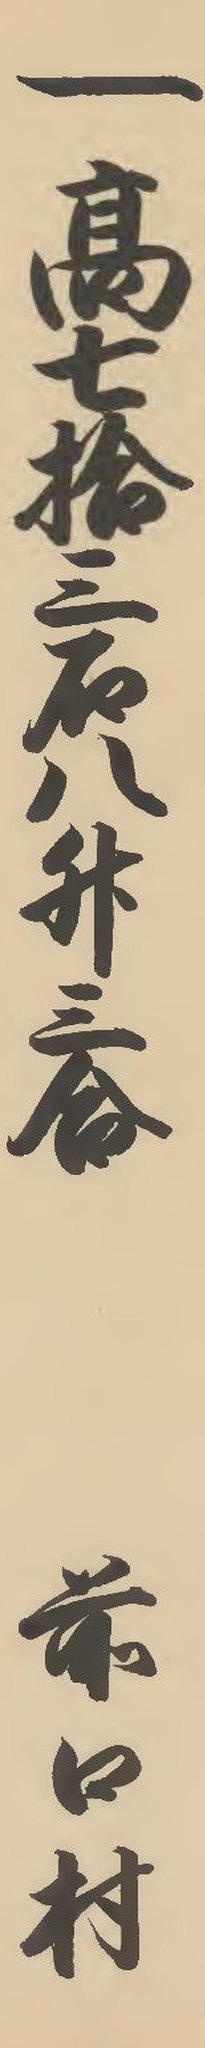一髙七拾三石八升三合前口村
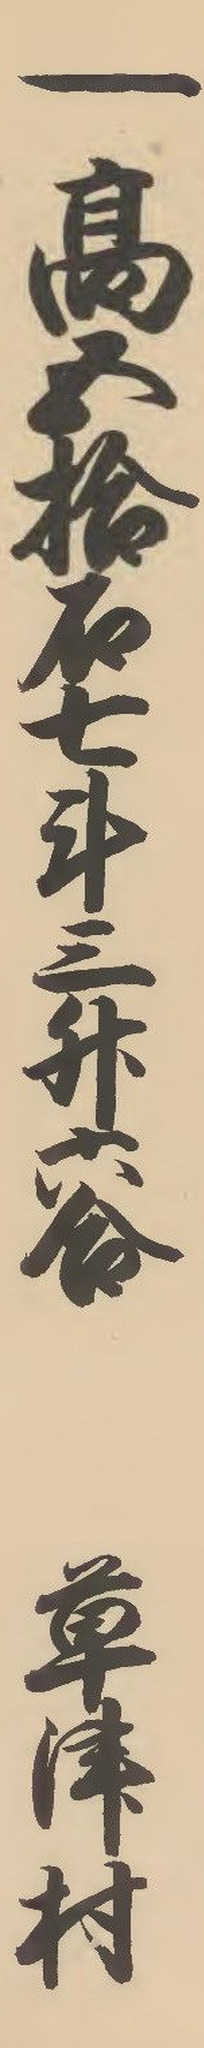一髙五拾石七斗三升六合草津村
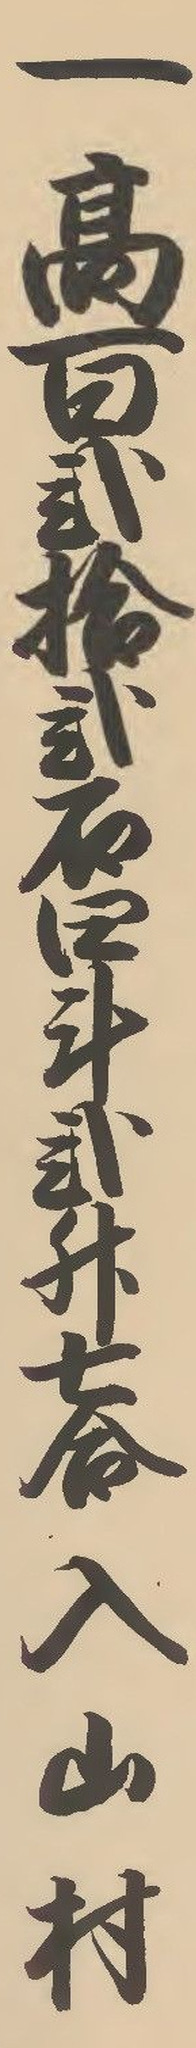一髙百弐拾弐石四斗弐升七合入山村
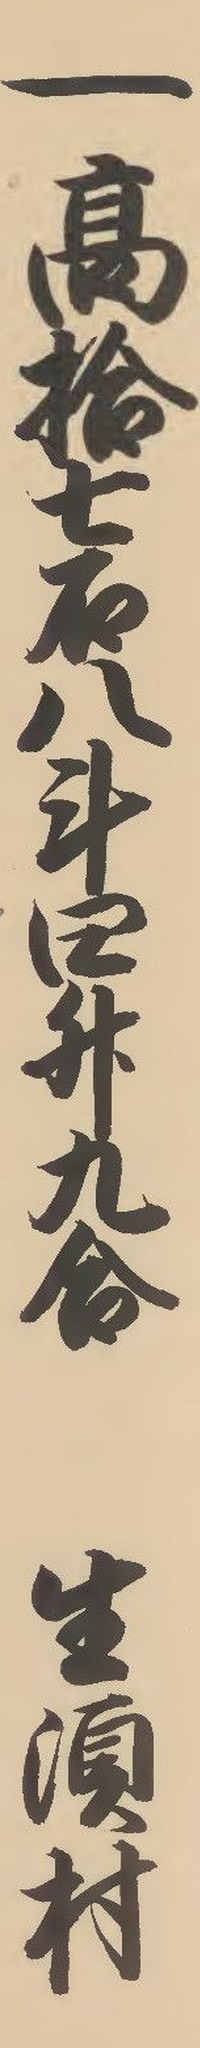一髙拾七石八斗四升九合生須村
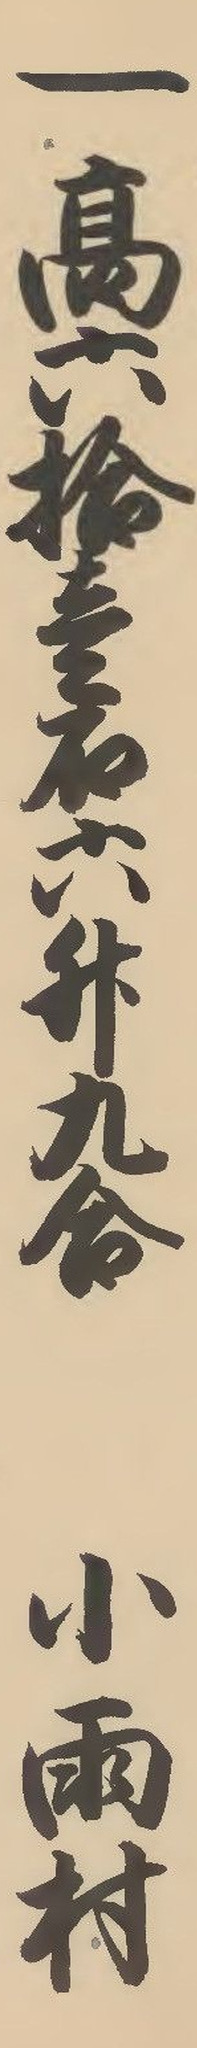一髙六拾壱石六升九合小雨村
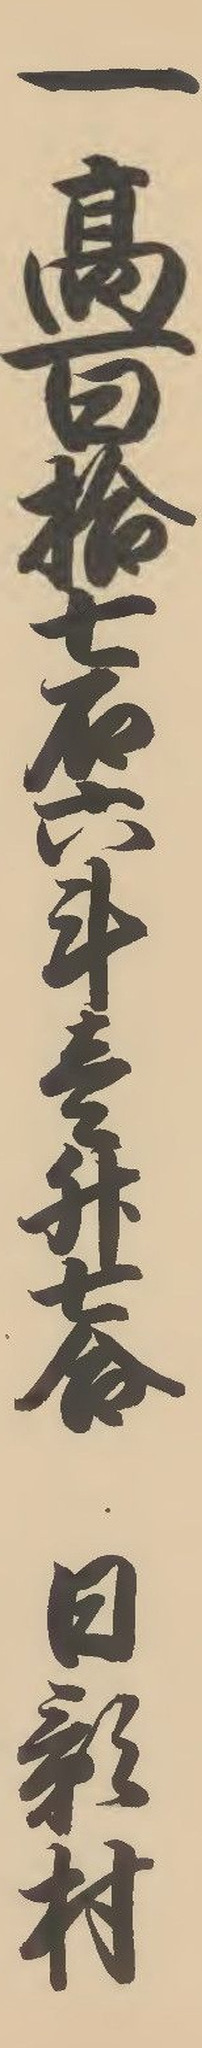一髙百拾七石六斗壱升七合日影村
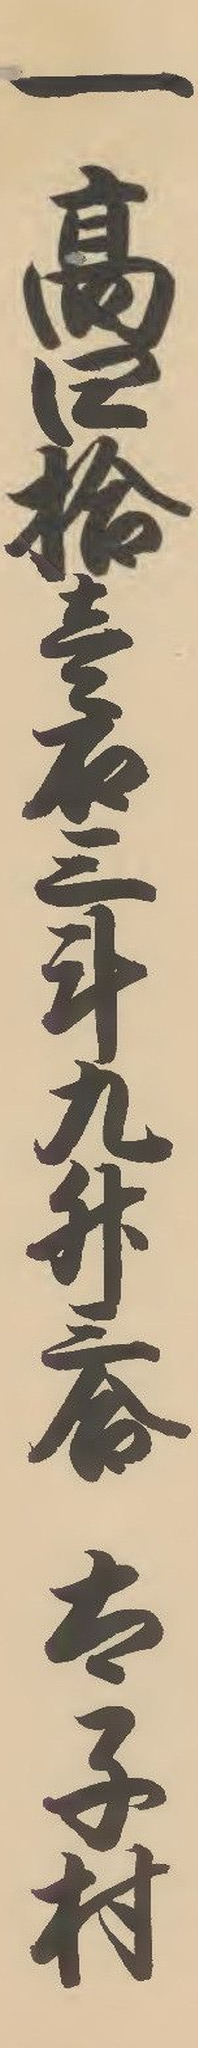一髙四拾壱石三斗九升三合太子村

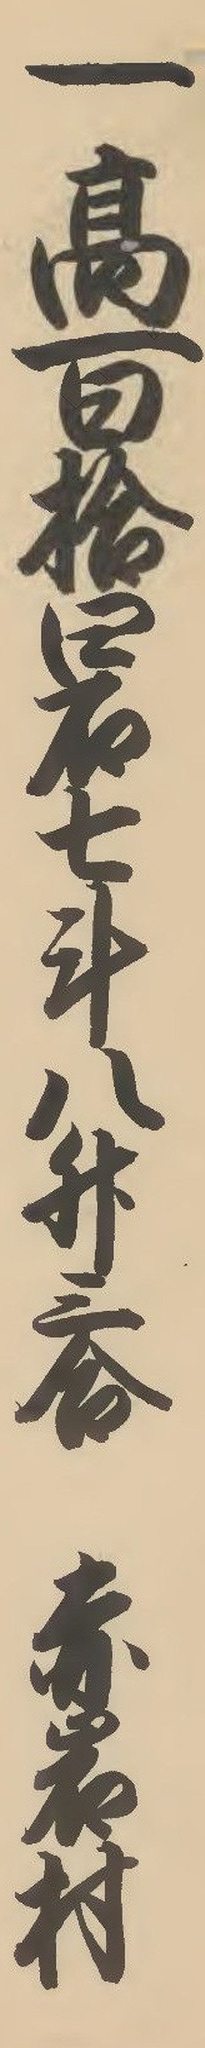一髙百拾四石七斗八升三合赤岩村
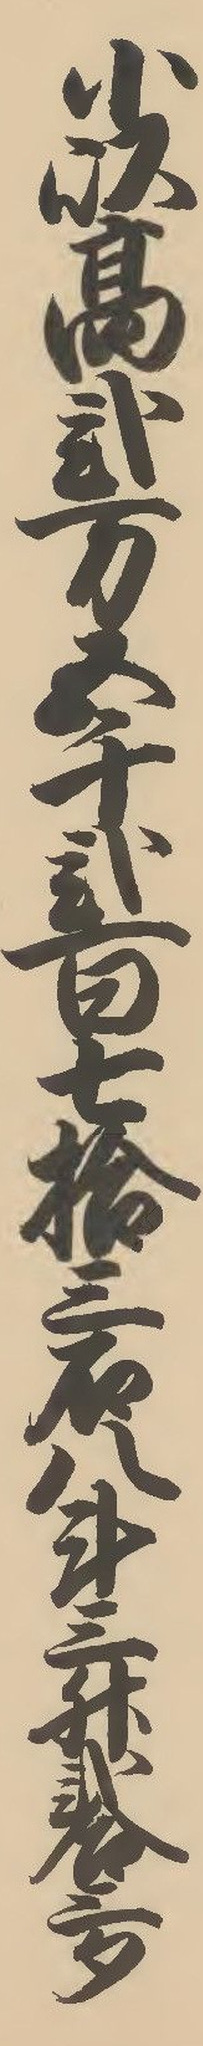小以髙弐万五千弐百七拾三石八斗三升弐合三夕
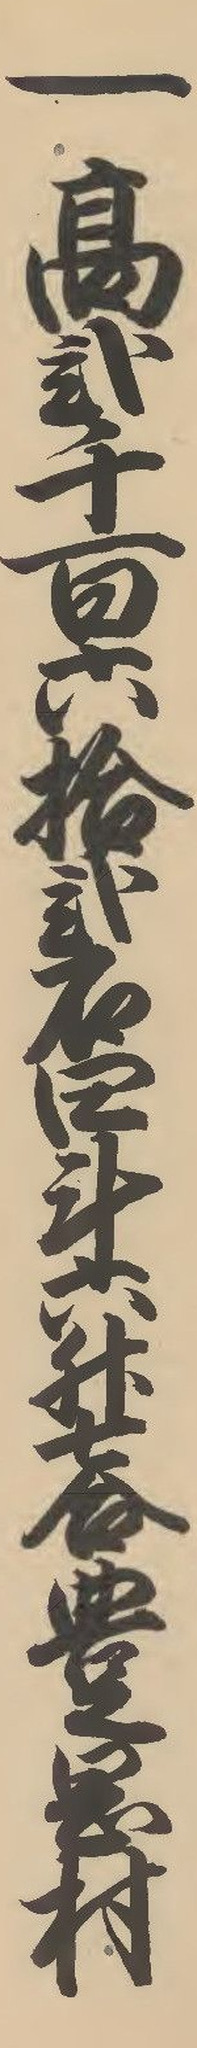一髙弐千百六拾弐石四斗六升七合豊岡村
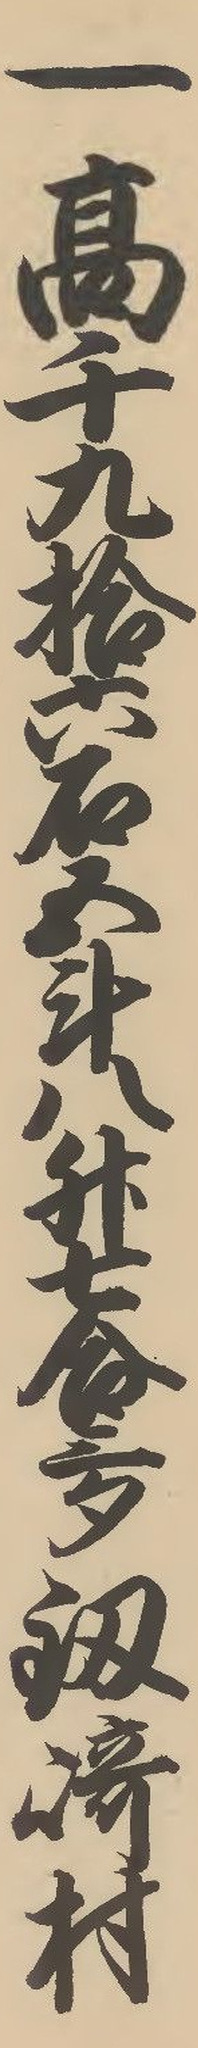一髙千九拾六石五斗八升七合三夕剱崎村
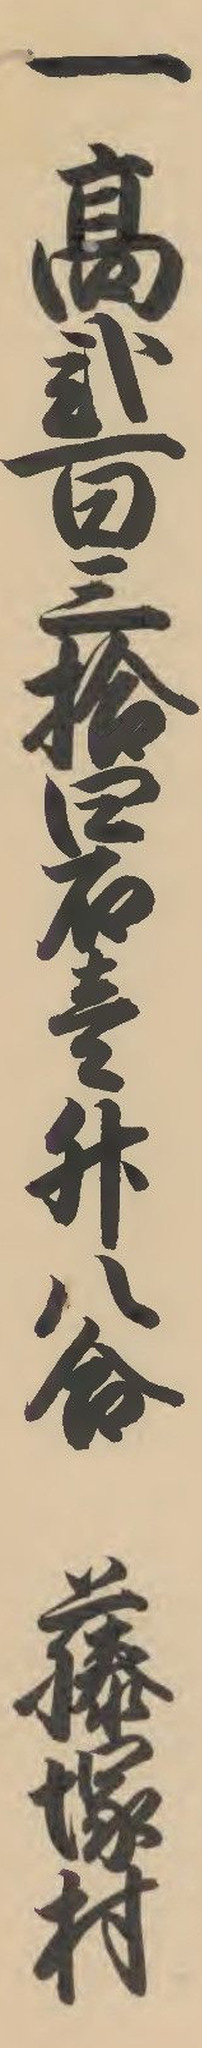一髙弐百三拾四石壱斗八合藤塚村

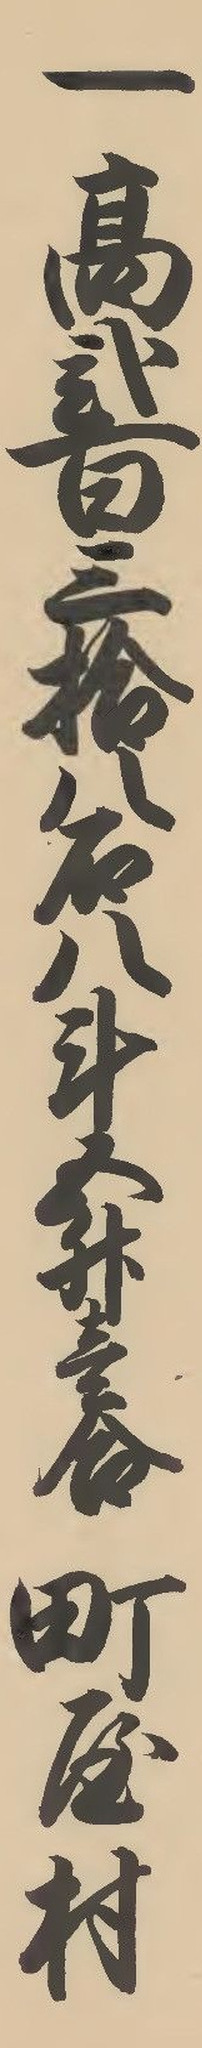一髙弐百三拾八石八斗五升壱合町屋村
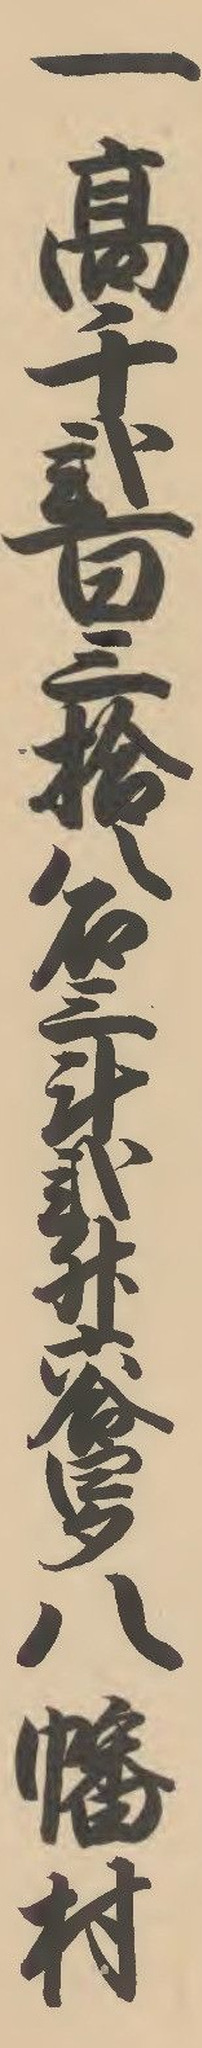一髙千弐百三拾八石三斗弐升六合四夕八幡村
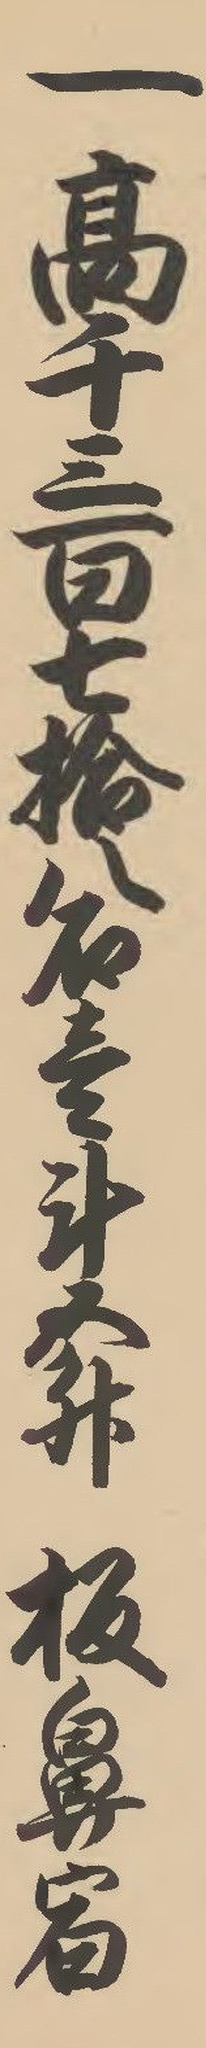一髙千三百七拾八石壱斗五升板鼻宿
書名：上野国郷帳
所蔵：国立公文書館 National Archives of Japan
